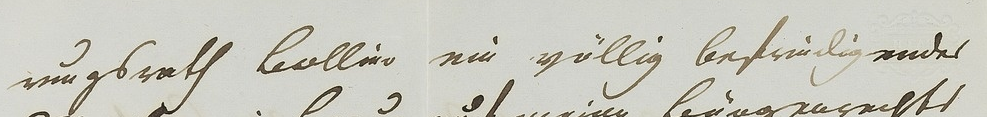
rungsrath Bollier ein völlig befriedigendes
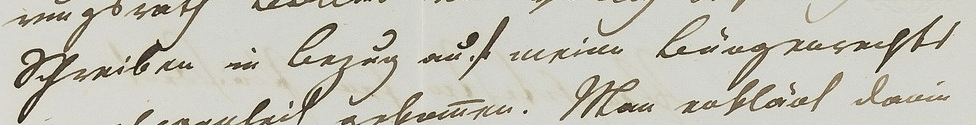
Schreiben in Bezug auf meine Bürgerrechts-
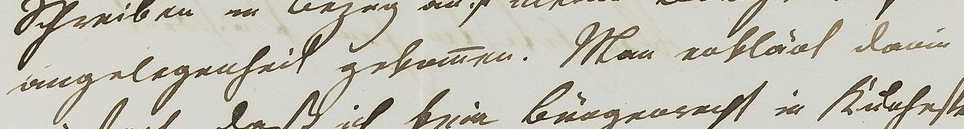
angelegenheit gekommen. Man erklärt darin
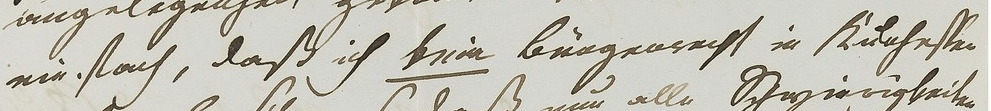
einfach, daß ich kein Bürgerrecht in Kurhessen
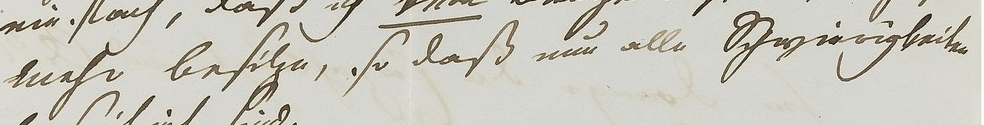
mehr besitze, so daß nun alle Schwierigkeiten
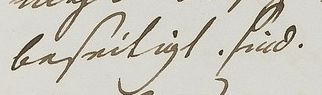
beseitigt sind.
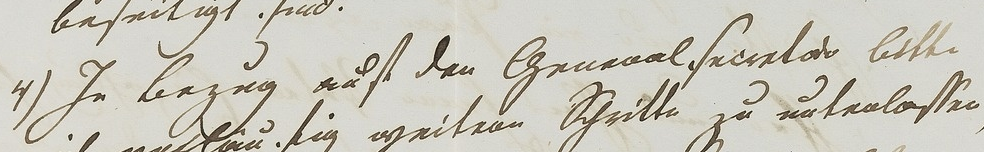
4) In Bezug auf den Generalsecretär bitte
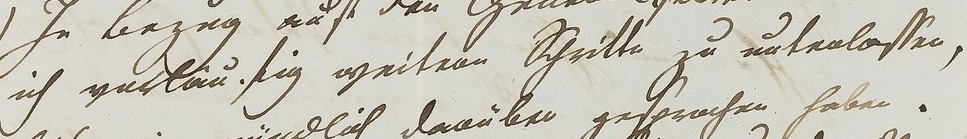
ich vorläufig weitere Schritte zu unterlassen,
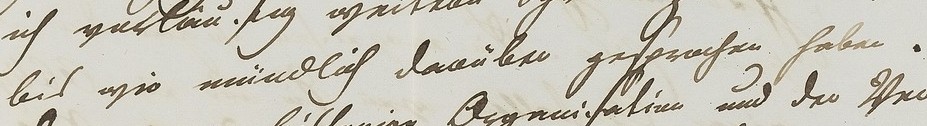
bis wir mündlich darüber gesprochen haben.
